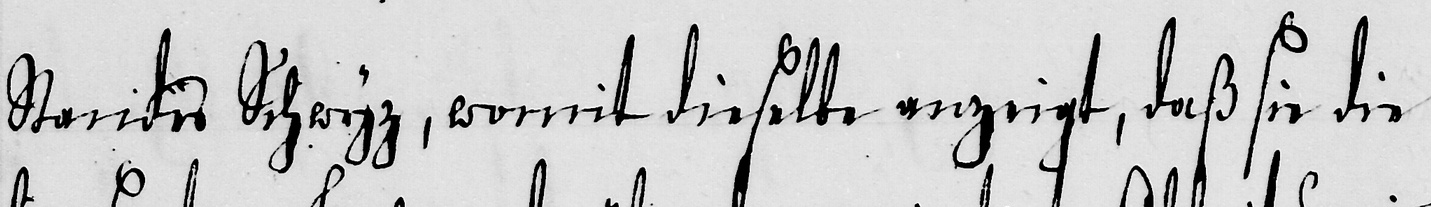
Standes Schwyz, womit dieselbe anzeigt, daß sie die
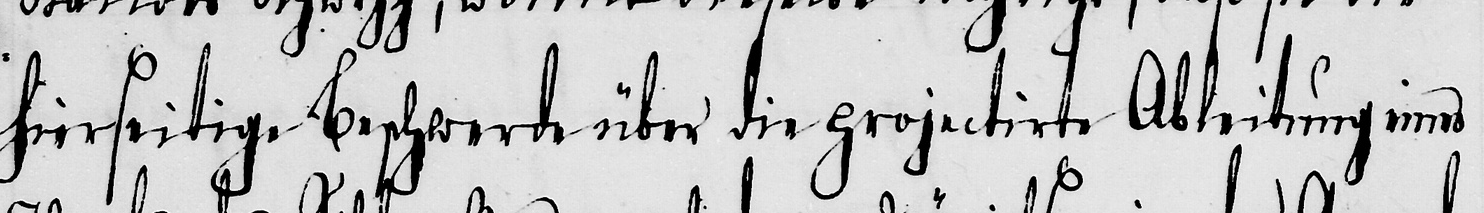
hierseitige Beschwerde über die projectirte Ableitung ei¬
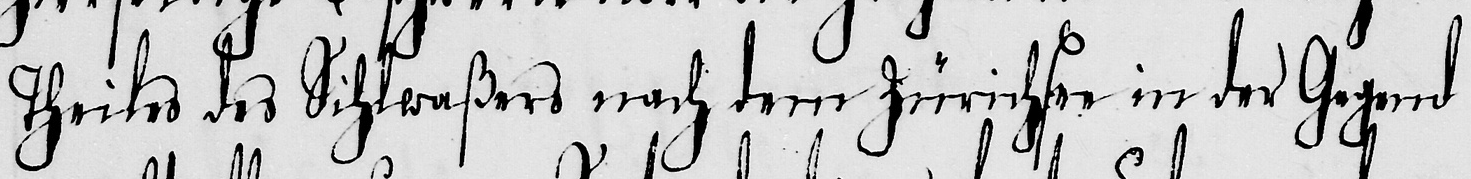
Theiles des Sihlwaßers nach dem Zürichsee in der Gegend
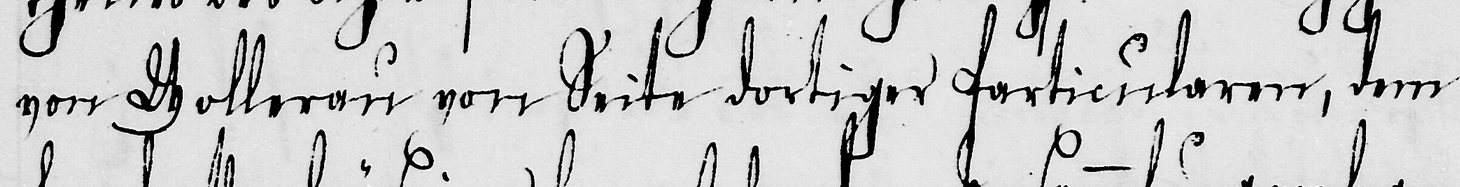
von Wollerau von Seite dortiger Particularen, dem
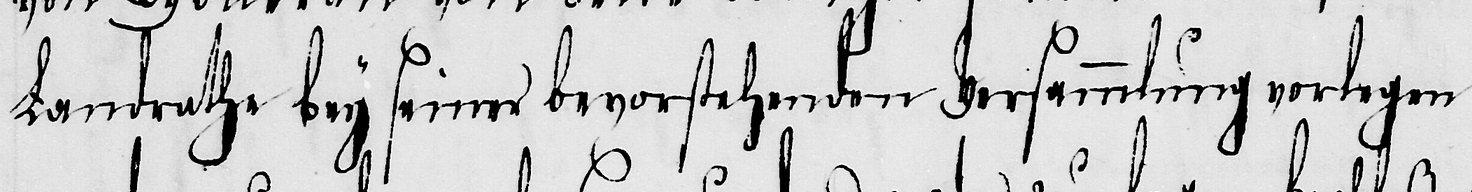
Landrathe bey seiner bevorstehenden Versammlung vorlegen
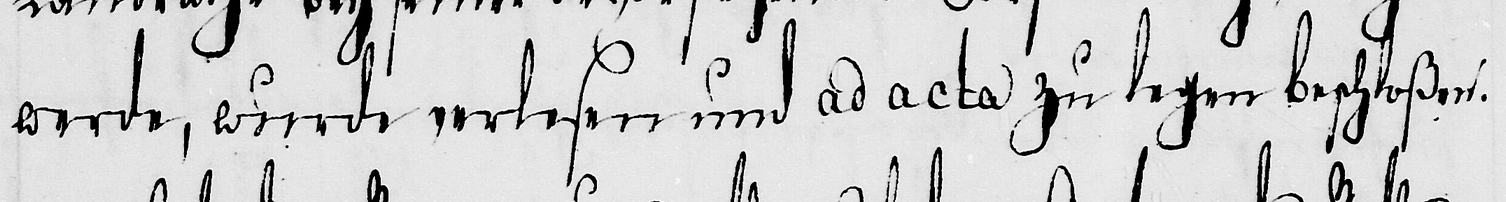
werden, wurde verlesen und ad acta zu legen beschloßen.
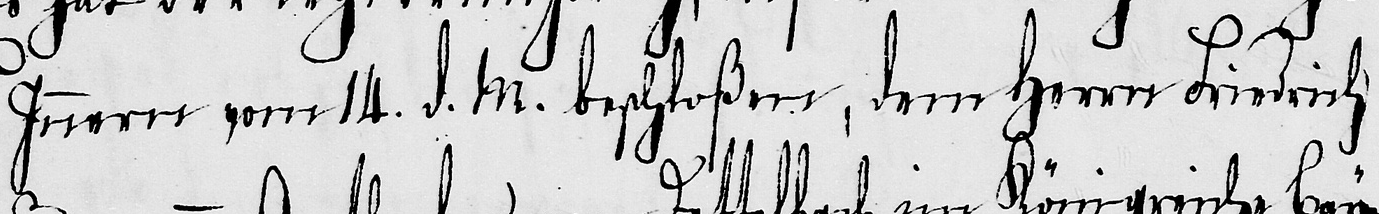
Innern vom 14. d. M. beschloßen, dem Herrn Friedrich
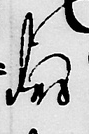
des
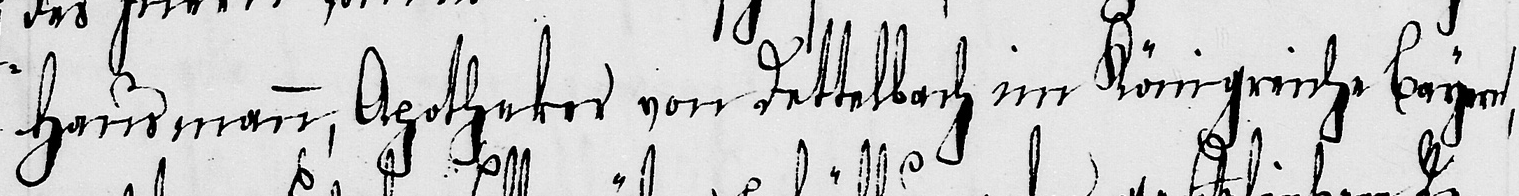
Hausmann, Apotheker von Dettelbach im Königreiche Bayern,
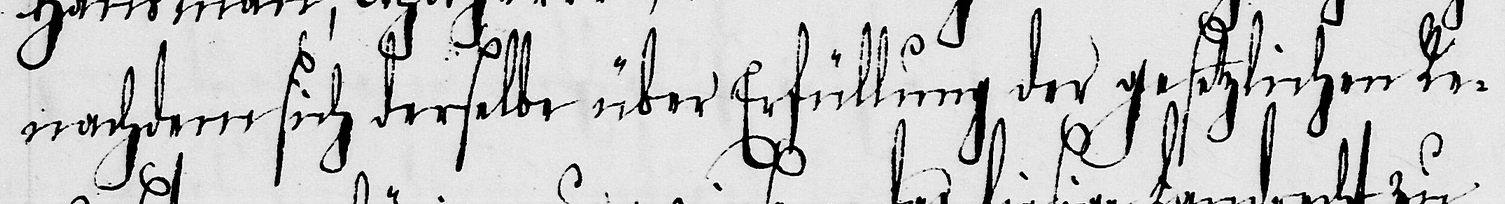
nachdem sich derselbe über Erfüllung der gesetzlichen Re¬
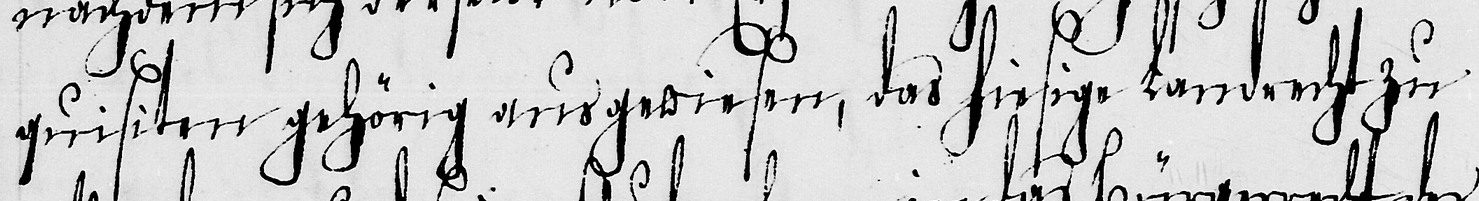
quisite gehörig ausgewiesen, das hiesige Landrecht zu
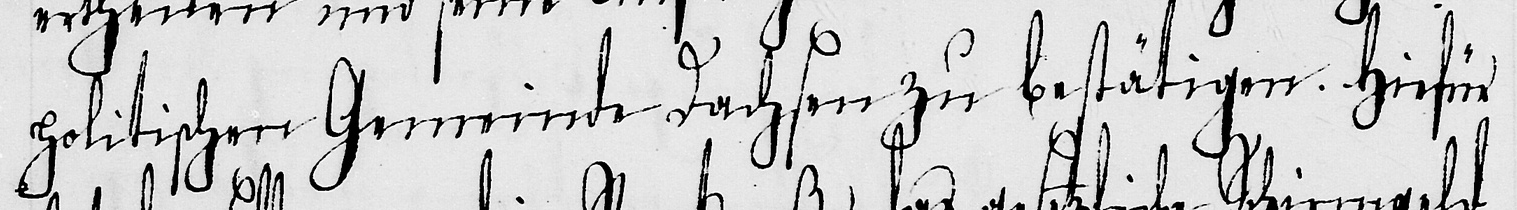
politischen Gemeinde Dachsen zu bestätigen. Hiefür
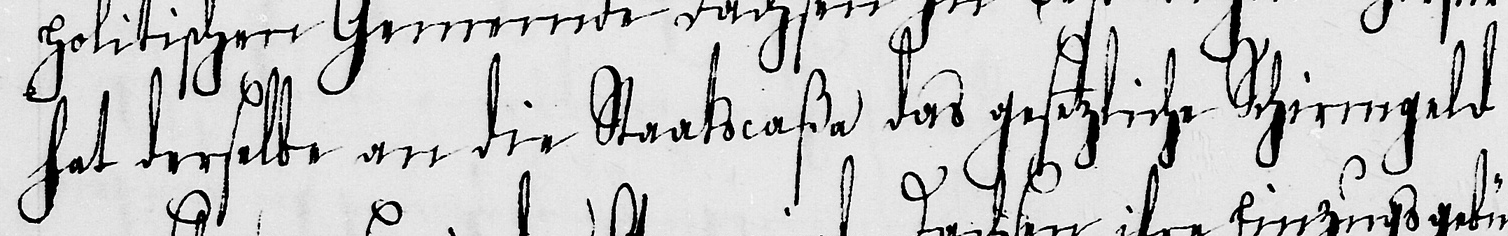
hat derselbe an die Staatscaßa das gesetzliche Schirmgeld
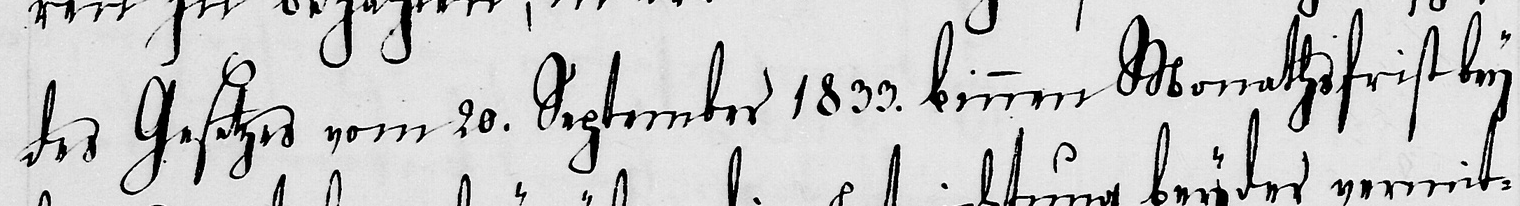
des Gesetzes vom 20. September 1833. binnen Monathsfrist bey
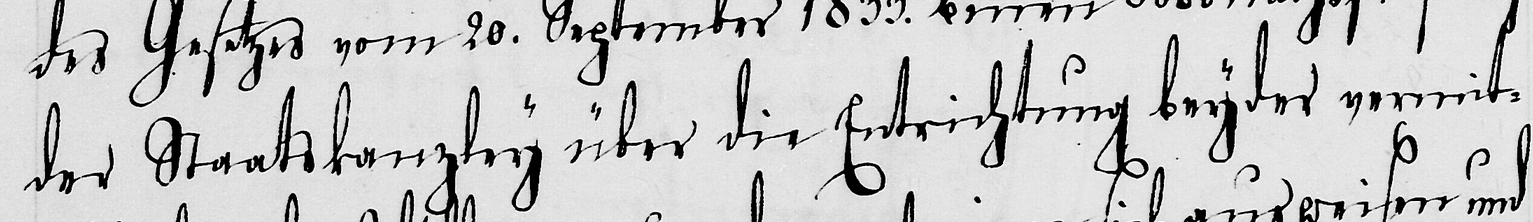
der Staatskanzley über die Entrichtung beyder vermit¬
